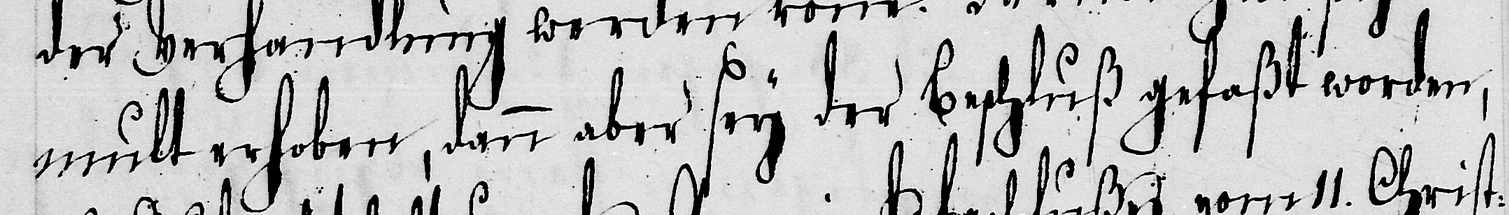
mult erhoben, dann aber sey der Beschluß gefaßt worden,
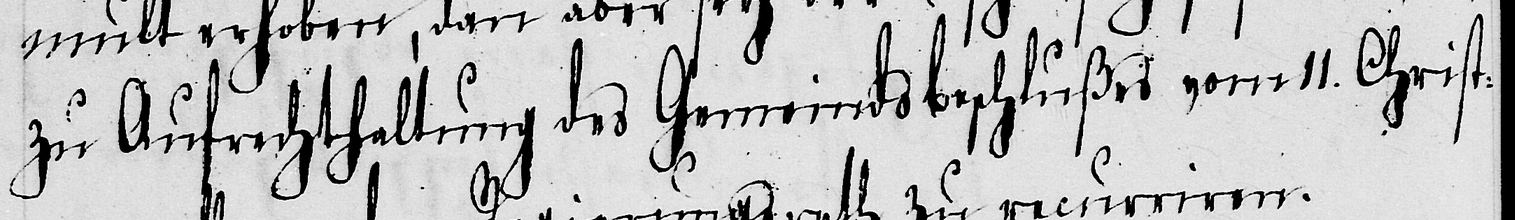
zu Aufrechthaltung des Gemeindsbeschlußes vom 11. Chris¬
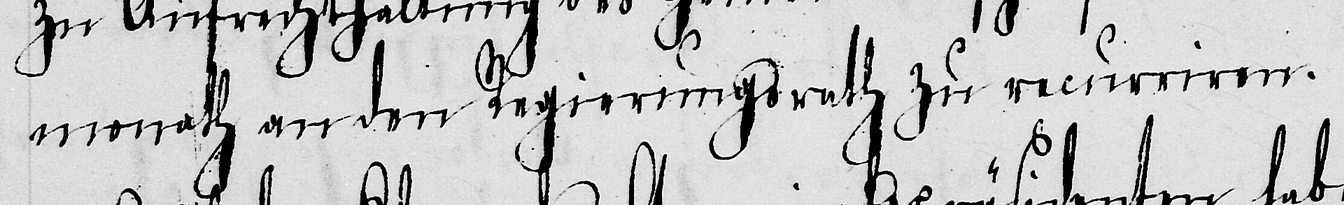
tmonath an den Regierungsrath zu recurriren.
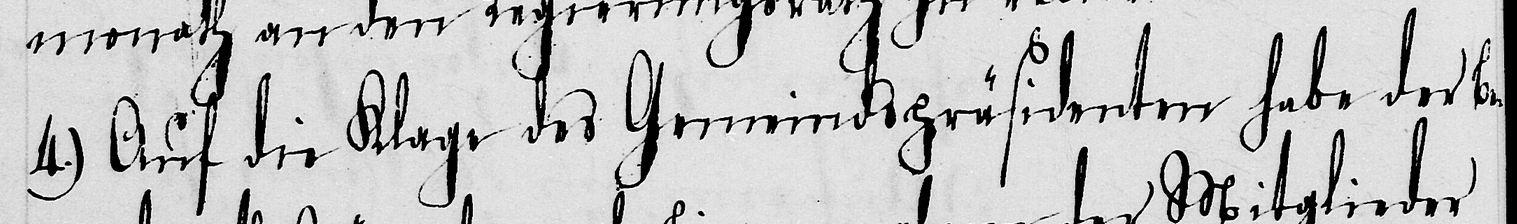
4.)Auf die Klage des Gemeindspräsidenten habe der B¬
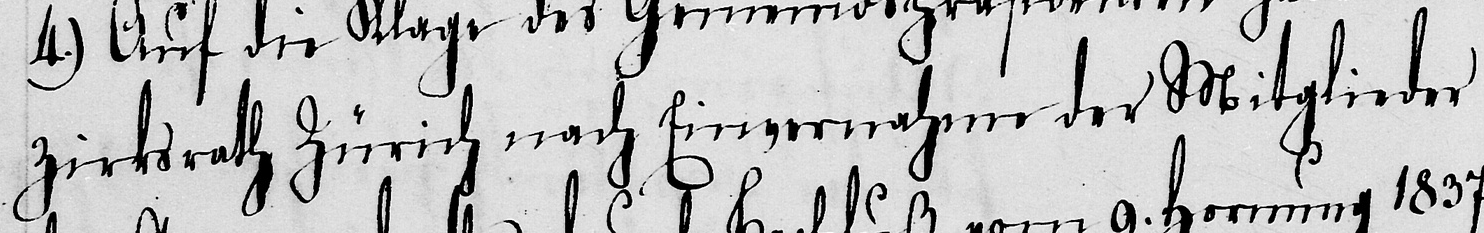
ezirksrath Zürich nach Einvernahme der Mitglieder
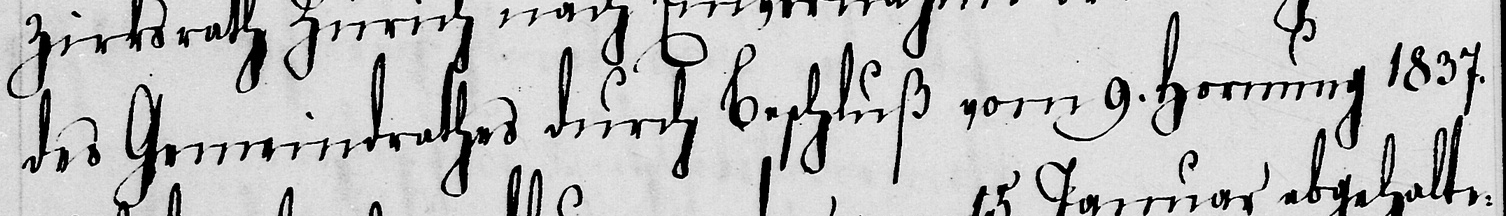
des Gemeindrathes durch Beschluß vom 9. Hornung 1837.
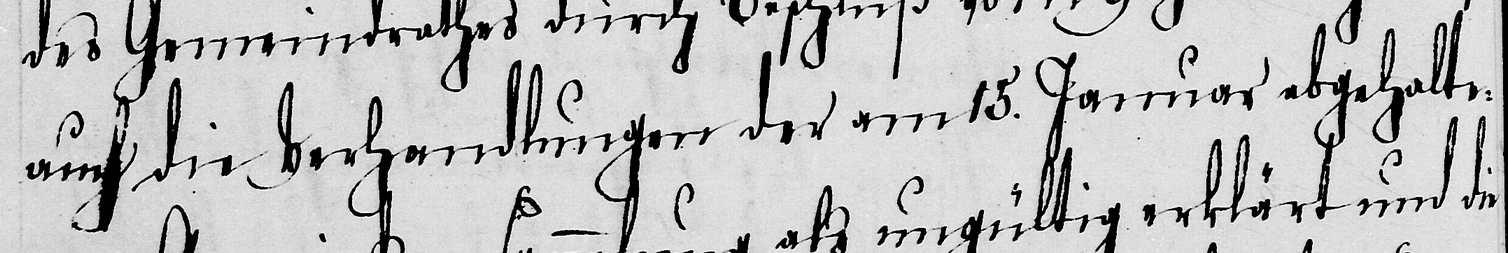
auf die Verhandlungen der am 15. Januar abgehalte¬
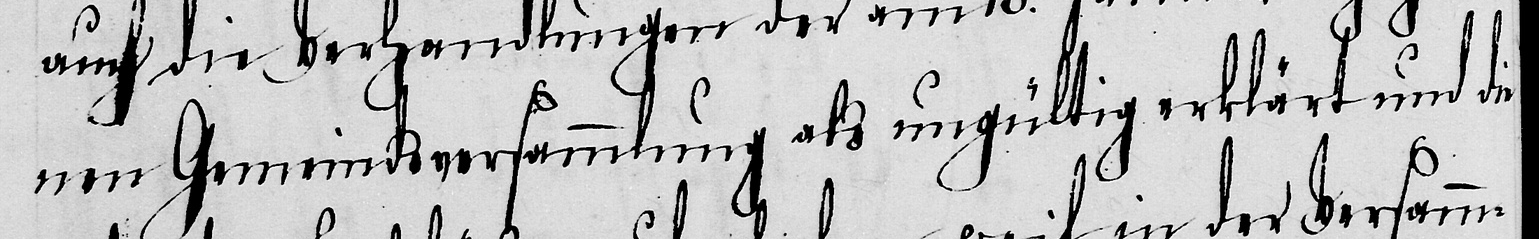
nen Gemeindsversammlung als ungültig erklärt und die
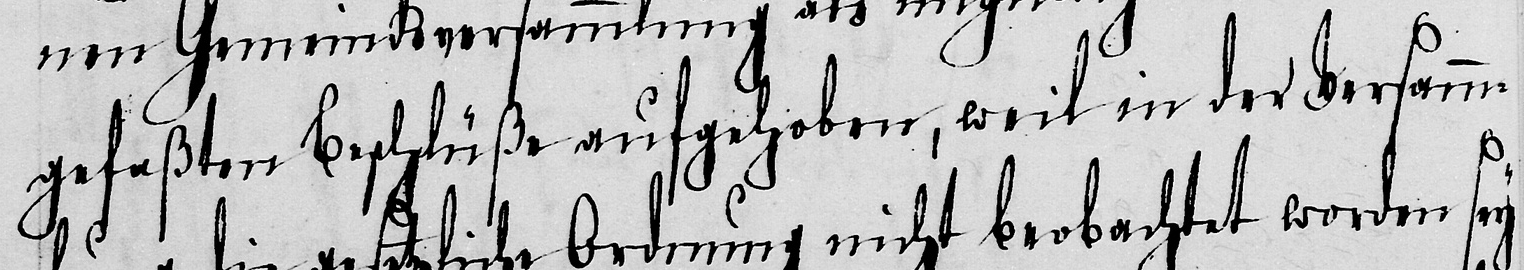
gefaßten Beschlüße aufgehoben, weil in der Versamm¬
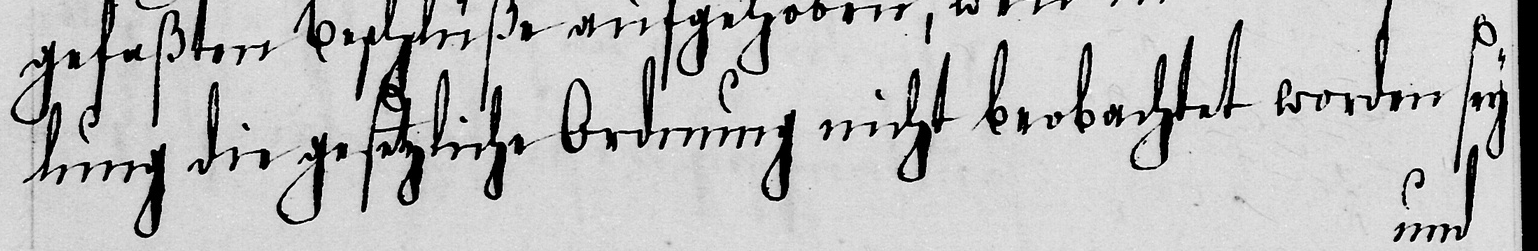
lung die gesetzliche Ordnung nicht beobachtet worden sey
